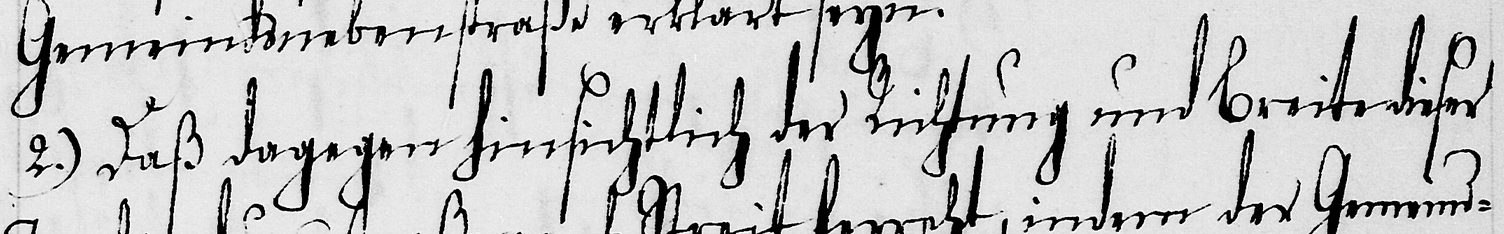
2.) Daß dagegen hinsichtlich der Richtung und Breite
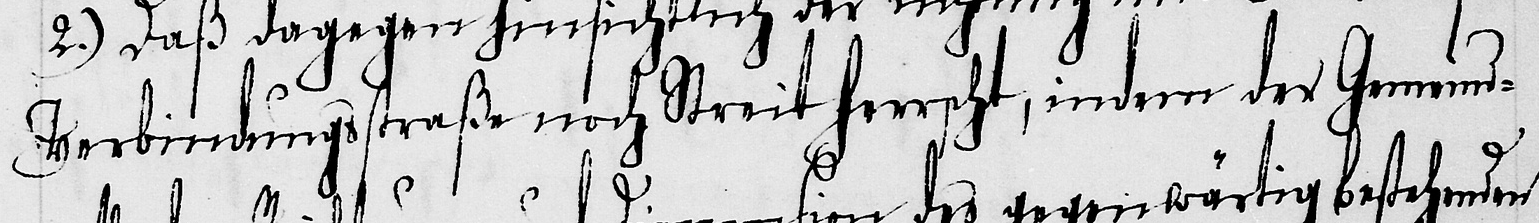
Verbindungsstraße noch Streit herrscht, indem der Gemeind¬
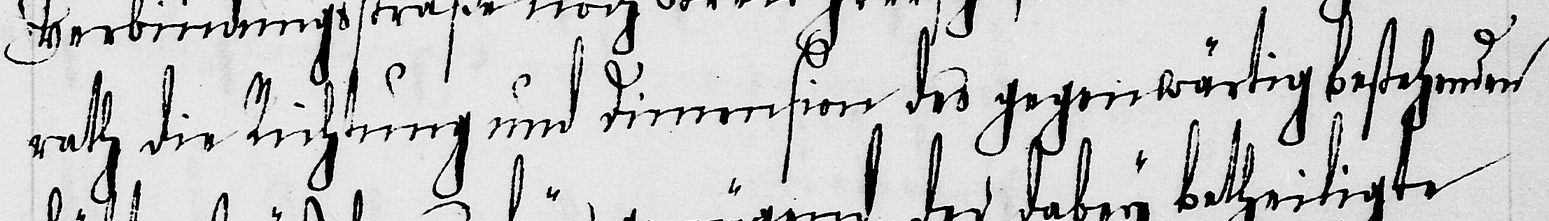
rath die Richtung und Dimension des gegenwärtig bestehenden
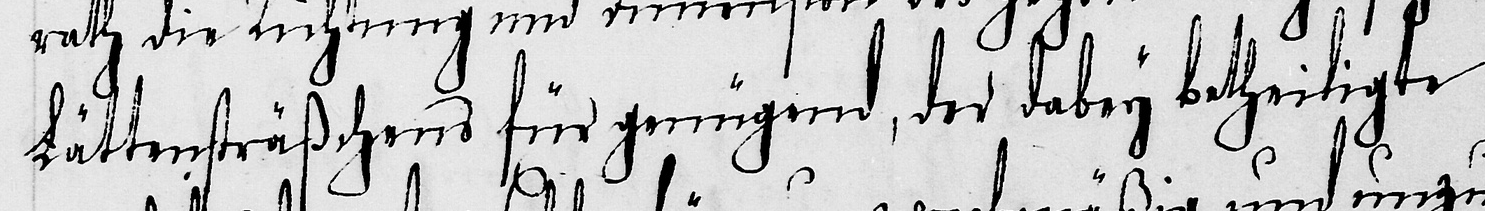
Lättensträßchens für genügend, dar dabey betheiligte
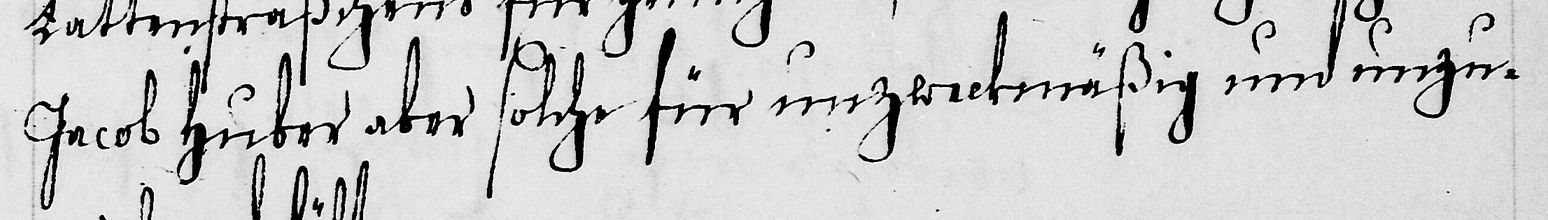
Jacob Huber aber solche für unzweckmäßig und unzu¬
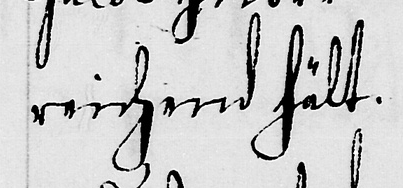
reichend hält.
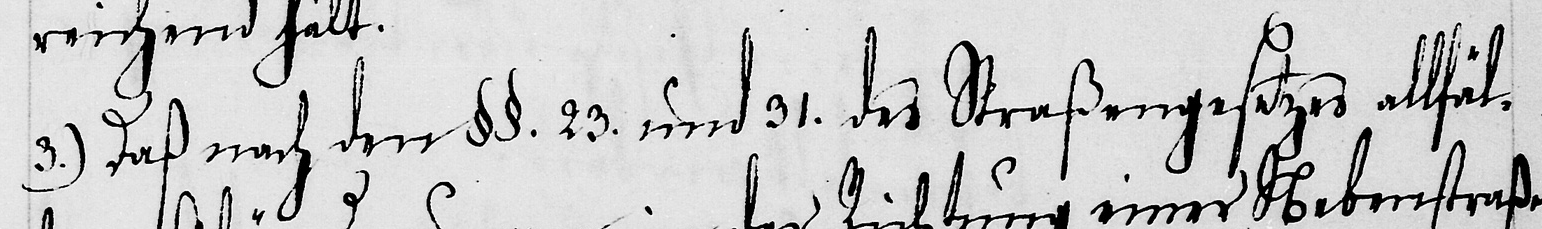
3.) Daß nach den §§. 23. und 31. des Straßengesetzes allfäl¬
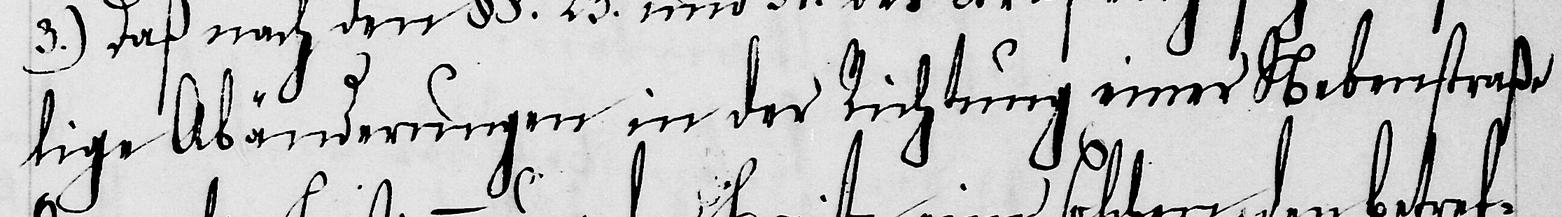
lige Abänderungen in der Richtung einer Nebenstraße
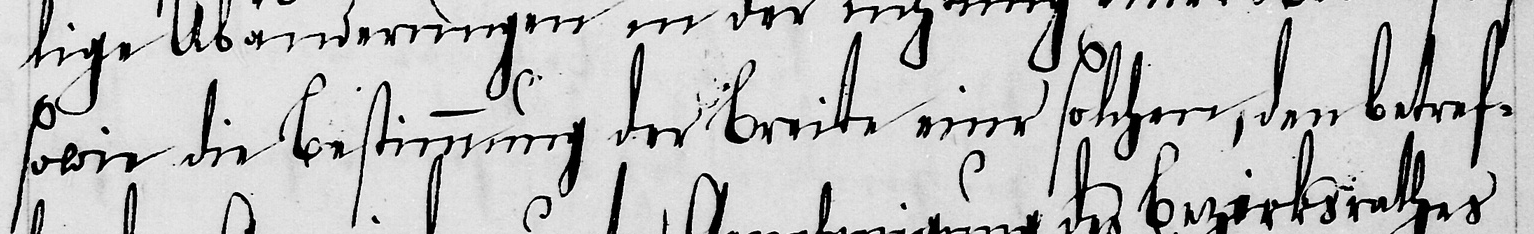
sowie die Bestimmung der Breite einer solchen, den betref¬
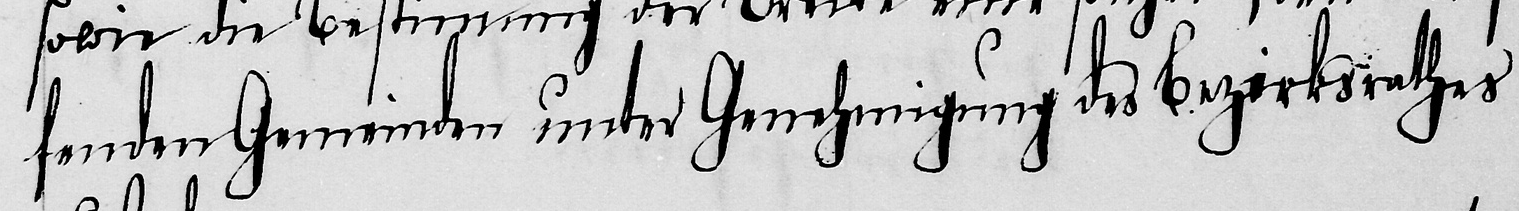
fenden Gemeinden unter Genehmigung des Bezirksrathes
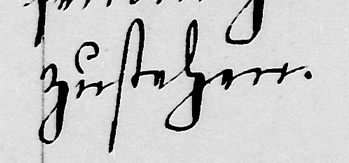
zustehen.
